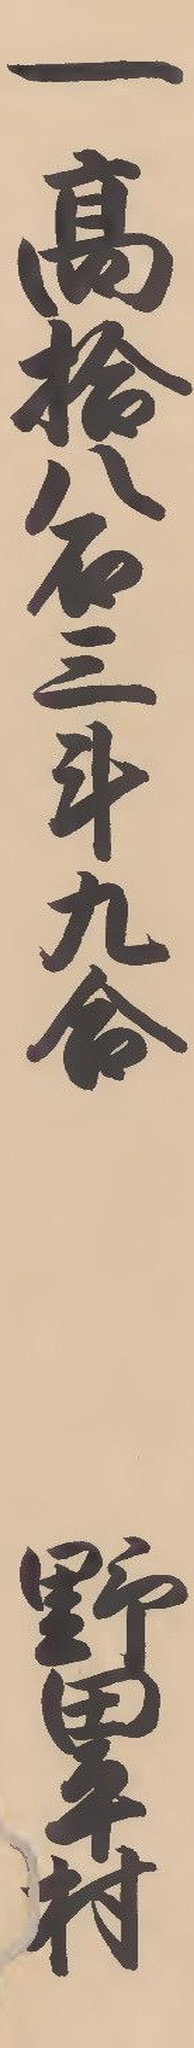一高拾八石三斗九合野田平村
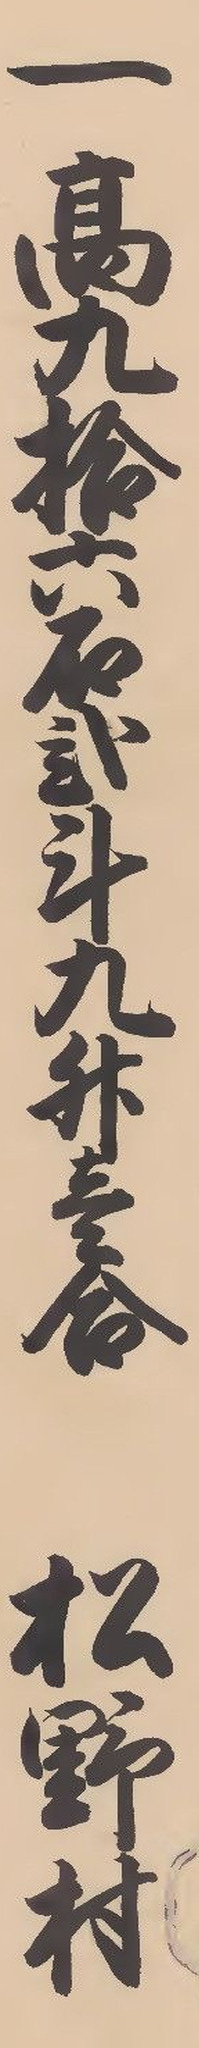一高九拾六石弐斗九升壱合松野村
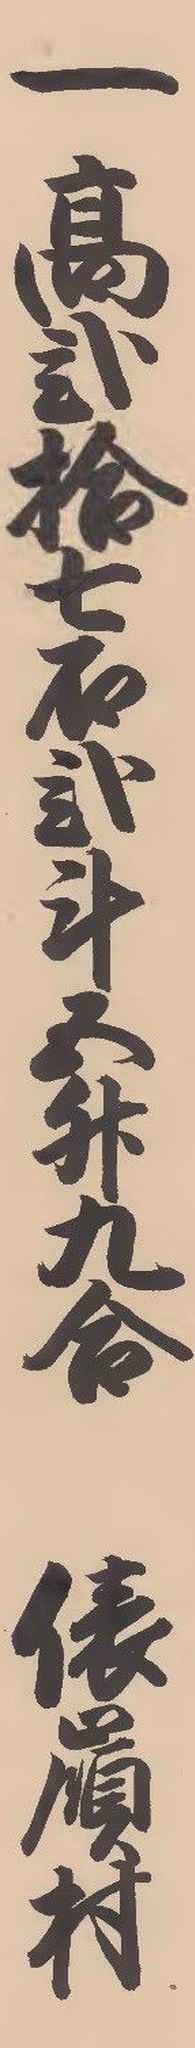一高弐拾七石弐斗五升九合俵嶺村
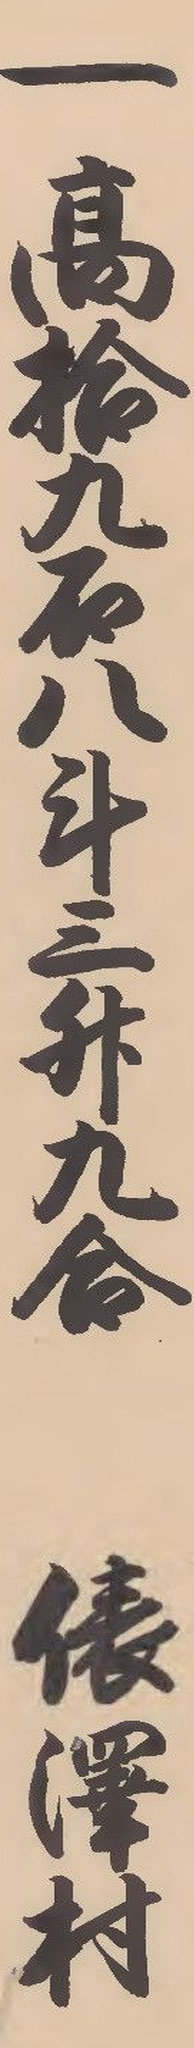一高拾九石八斗三升九合俵沢村

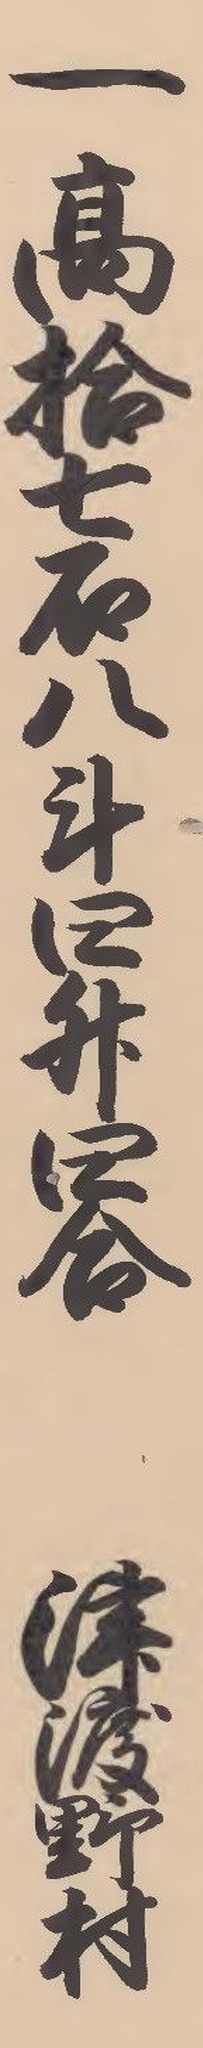一高拾七石八斗四升四合津渡野村
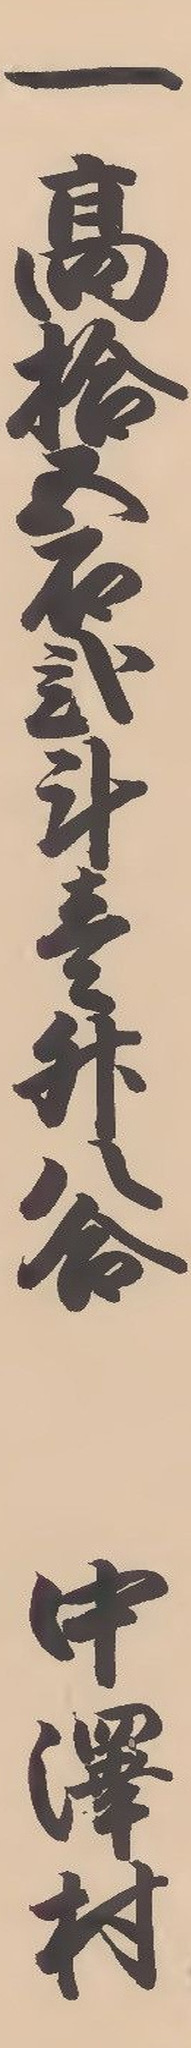一高拾五石弐斗壱升八合中沢村
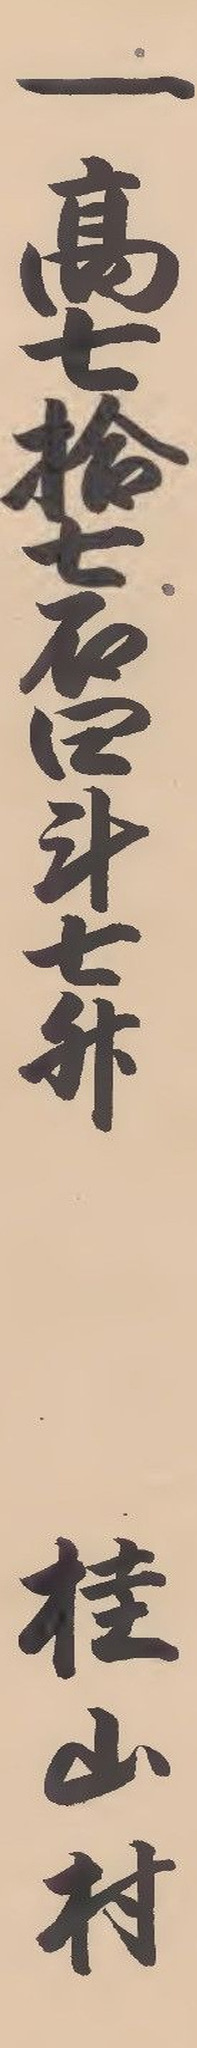一高七拾七石四斗七升桂山村
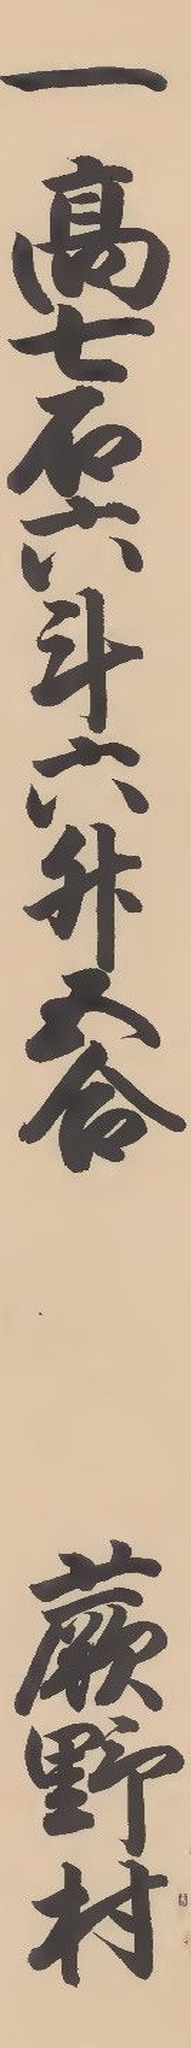一高七石六斗六升五合蕨野村
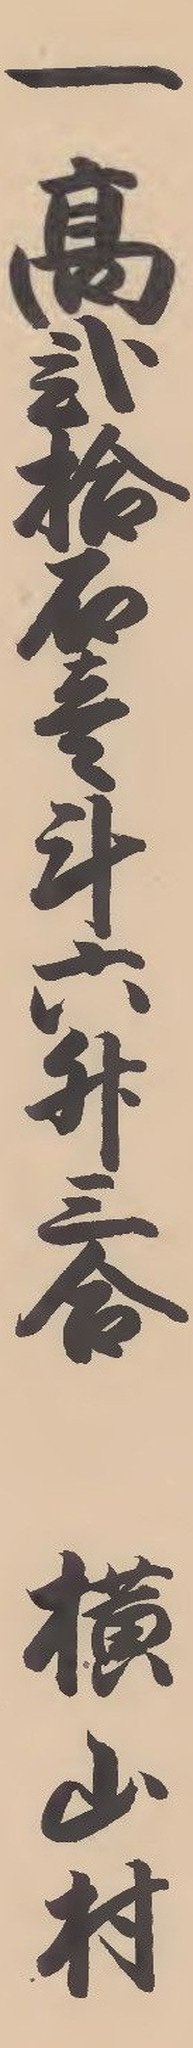一高弐拾石壱斗六升三合横山村
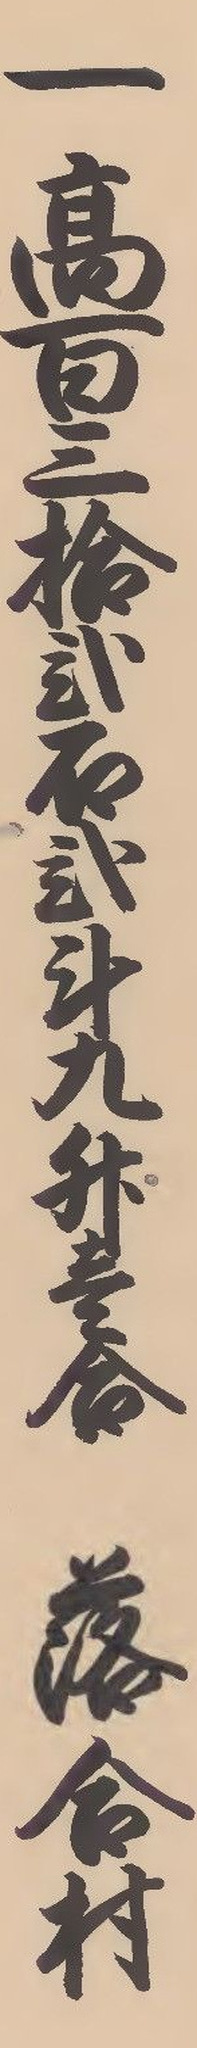一高百三拾弐石弐斗九升壱合落合村

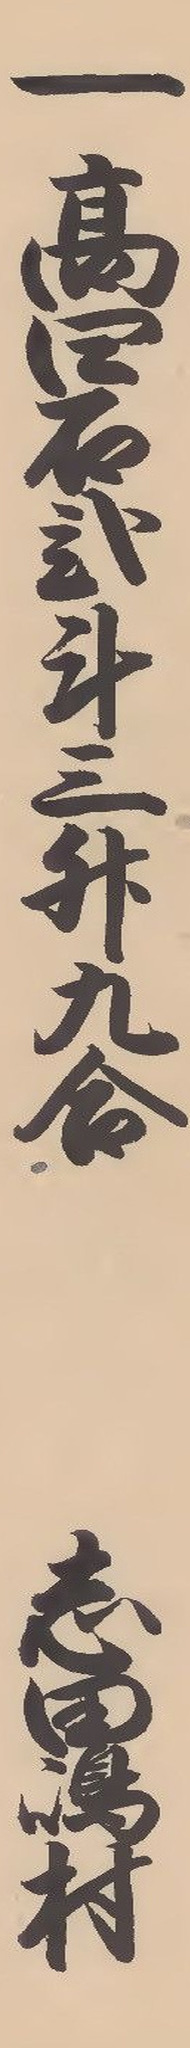一高四石弐斗三升九合志田島村
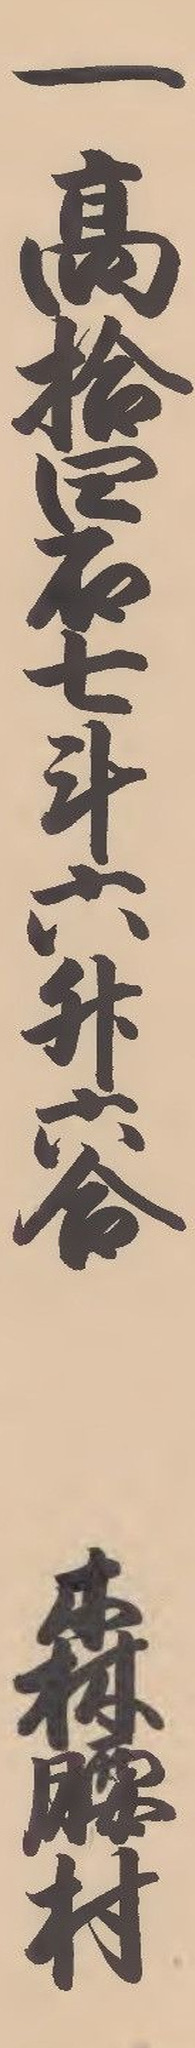一高拾四石七斗六升六合森腰村
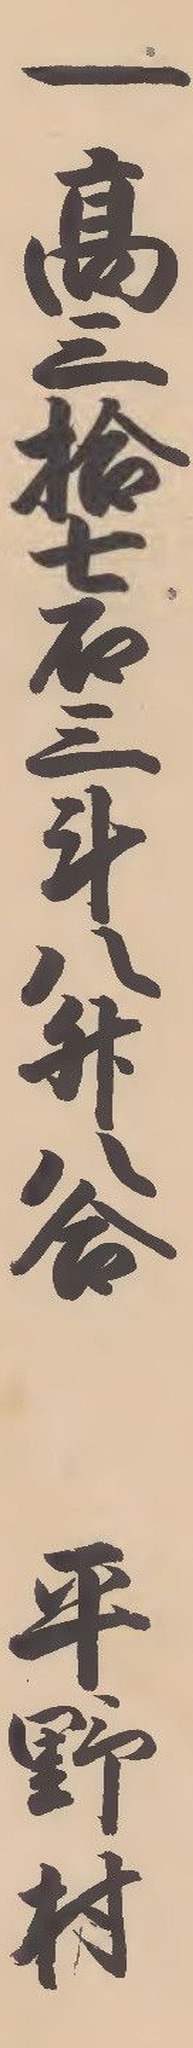一高三拾七石三斗八升八合平野村
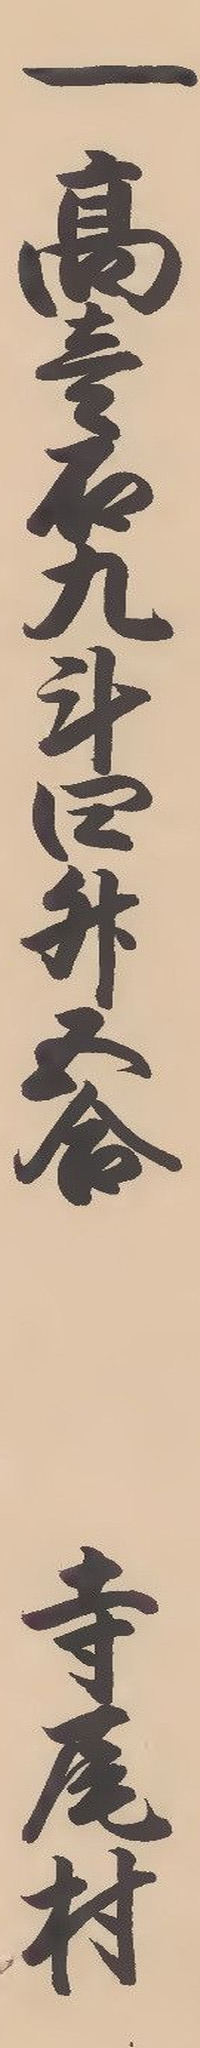一高壱石九斗四升五合寺尾村
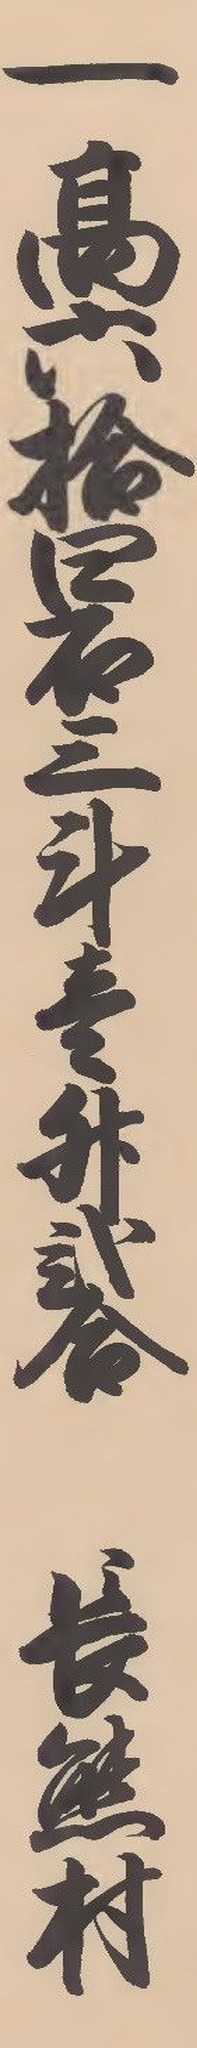一高六拾四石三斗壱升弐合長熊村
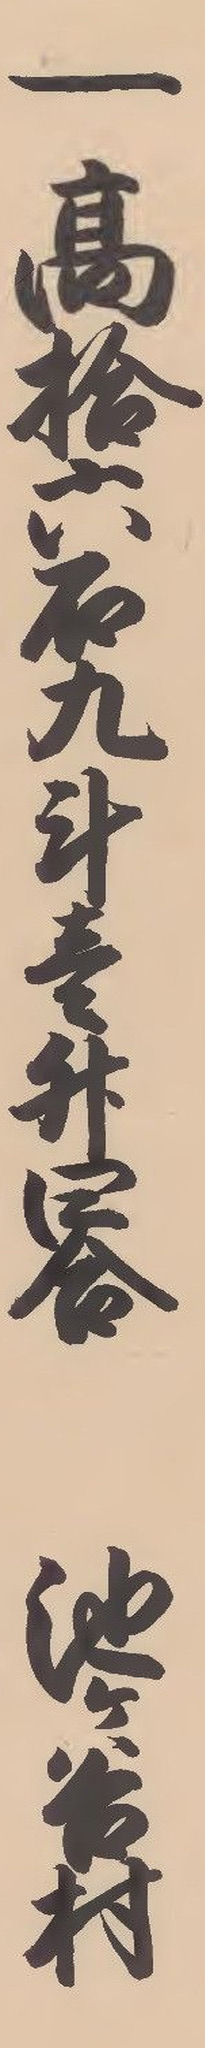一高拾六石九斗壱升四合池ヶ谷村
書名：駿河国郷帳
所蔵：国立公文書館 National Archives of Japan
